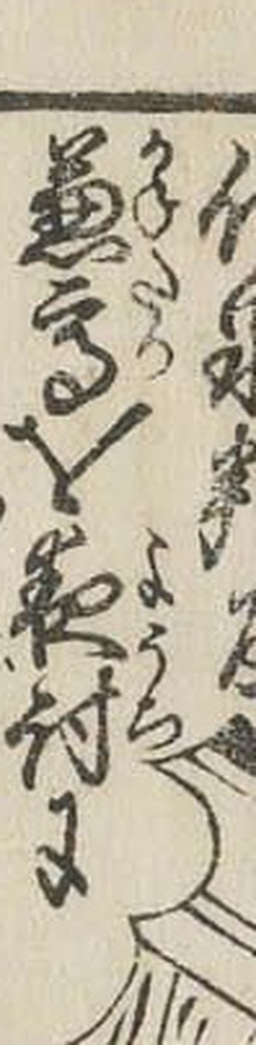兼高を夜討に
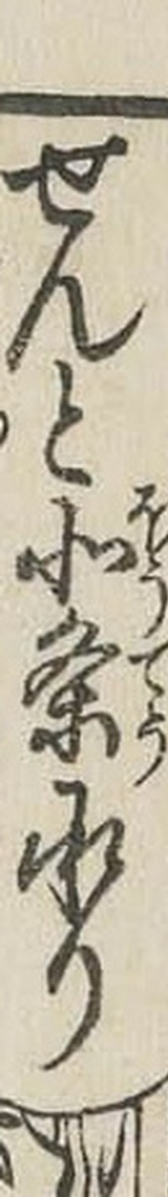せんと北条承り
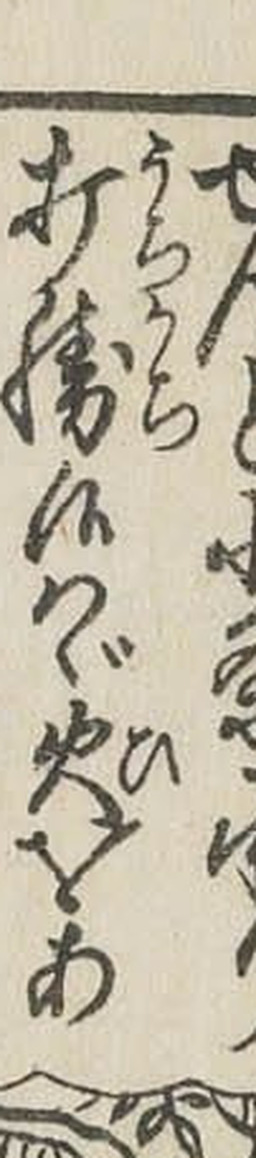打勝候はゞ火をあ
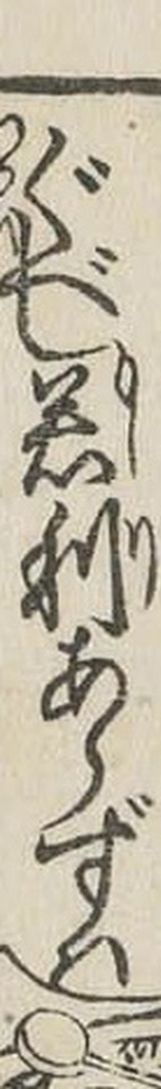ぐべし若利あらずは
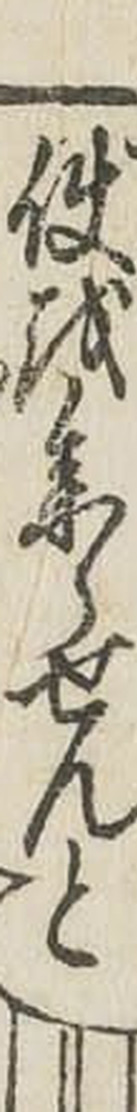使を参らせんと
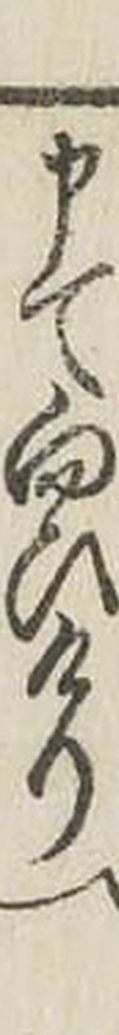申て向ひけり
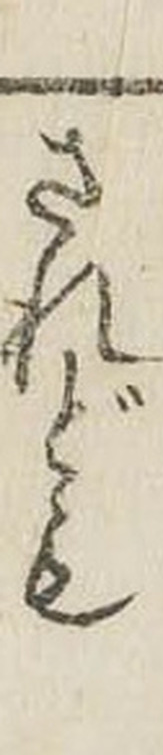されども
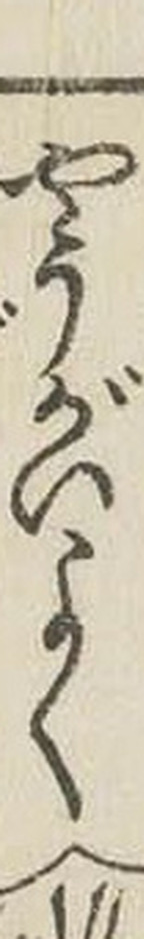やうがいよく
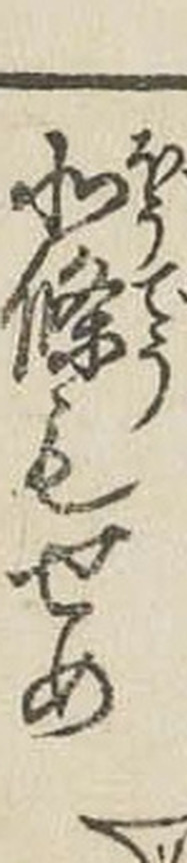北条もせめ
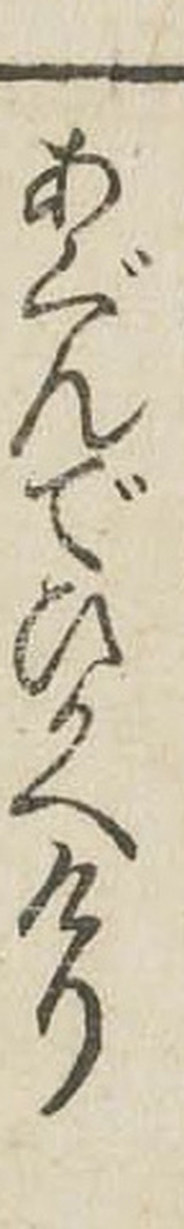あぐんでひかへけり
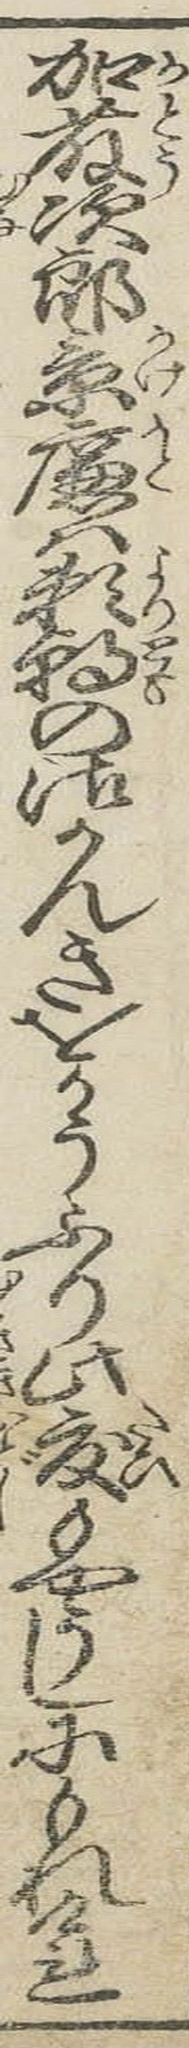加藤次郎景廉は頼朝の御かんきをかうふり此度もやうしにもれけれ
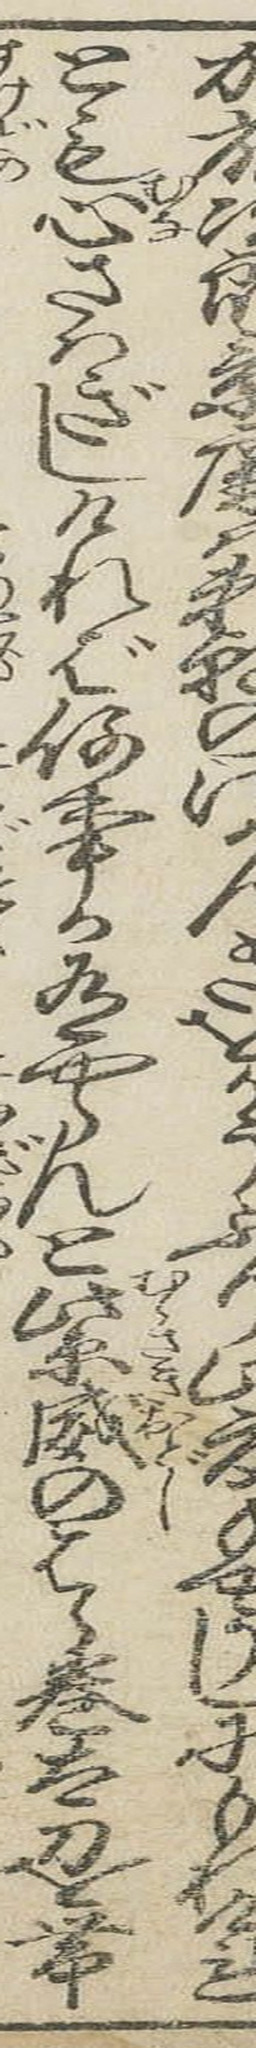とも心さわぎしければ何事か有やらんと紫威のはら巻太刀を帯
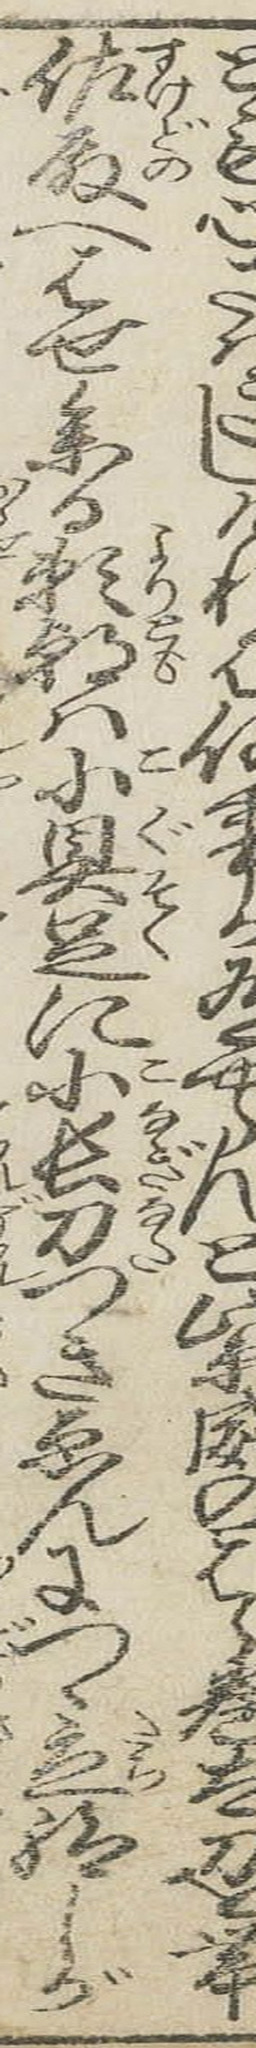佐殿へはせ参る頼朝は小具足に小長刀つきゑんにつゝ立給しが
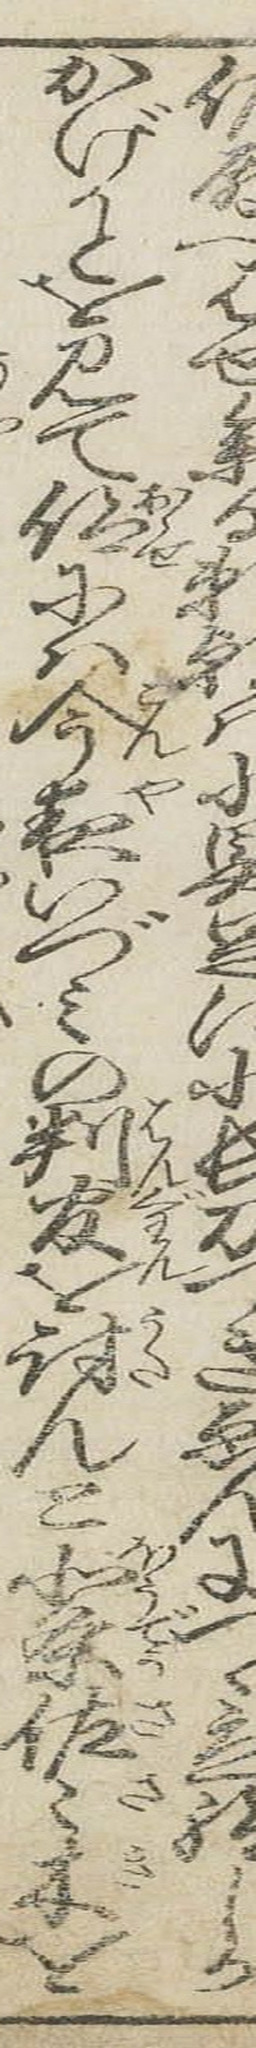かげかとを見て仰には今夜いづみの判官を討んと北条佐々木を
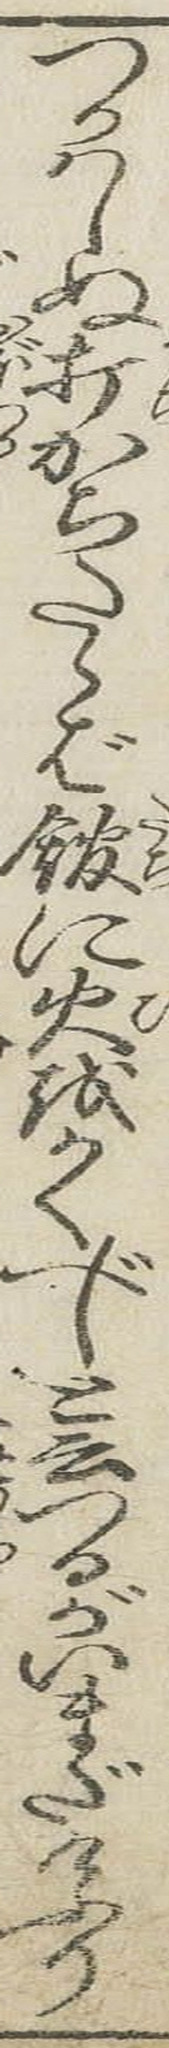つかはしぬ打かちたらば館に火をかくべしと云つるがいまだけふり
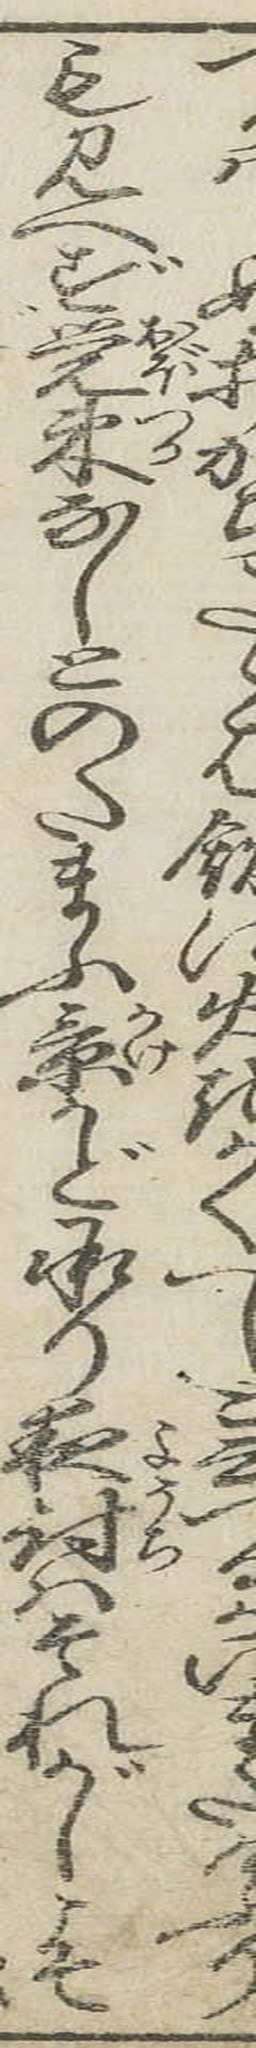も見へず覚束なしとのたまふ景かど承り夜討はそれがしこそ
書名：絵本写宝袋 9巻 3之巻
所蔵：東京学芸大学教育コンテンツアーカイブ
